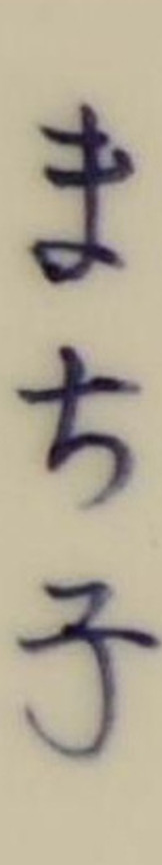まち子

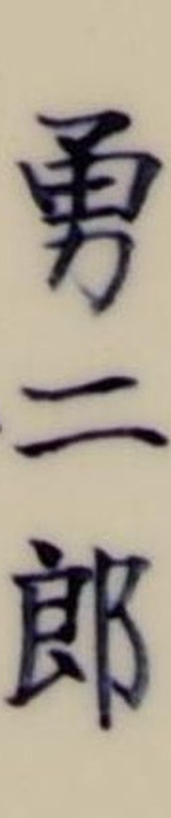勇二郎
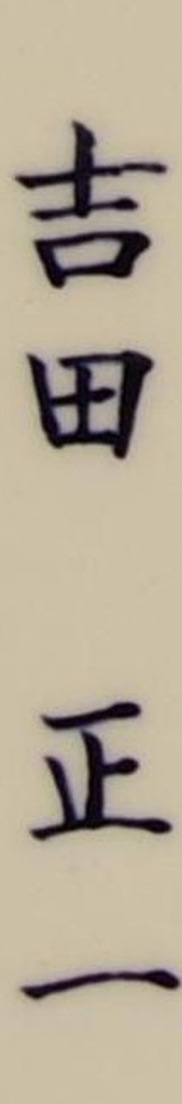吉田正一
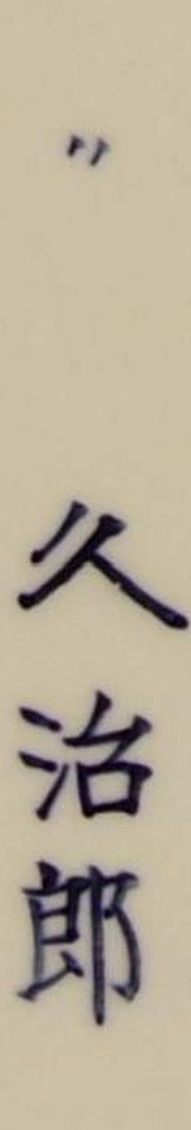久治郎
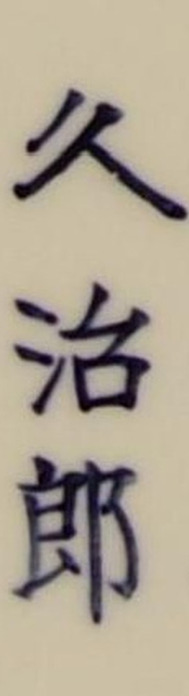久治郎
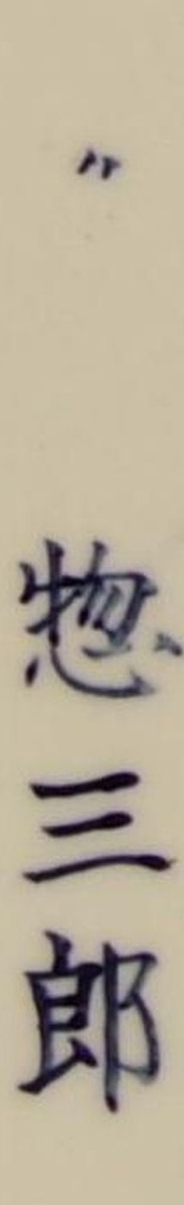惣三郎
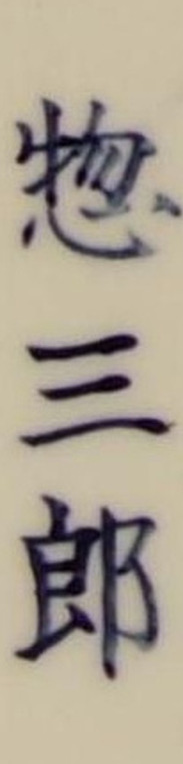惣三郎
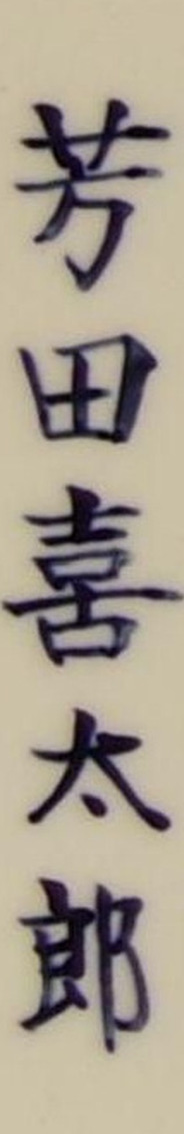芳田喜太郎
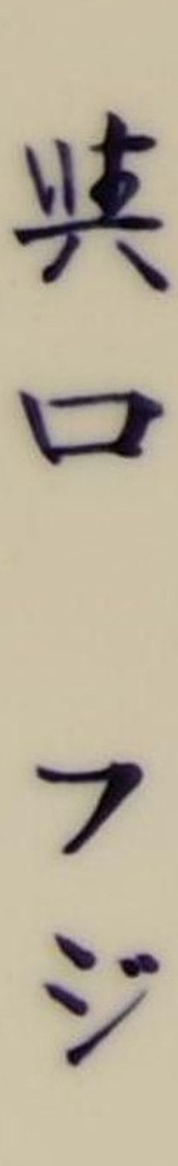与口フジ
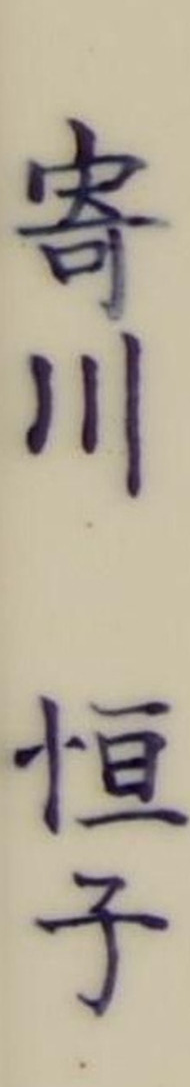寄川恒子

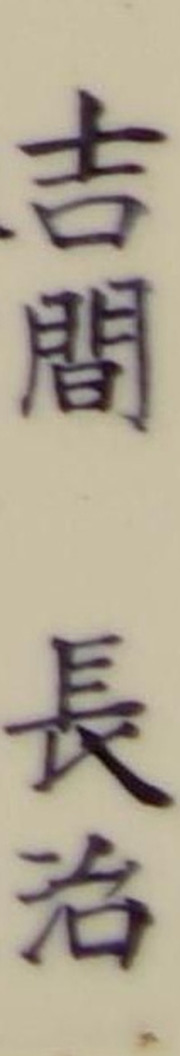吉間長治
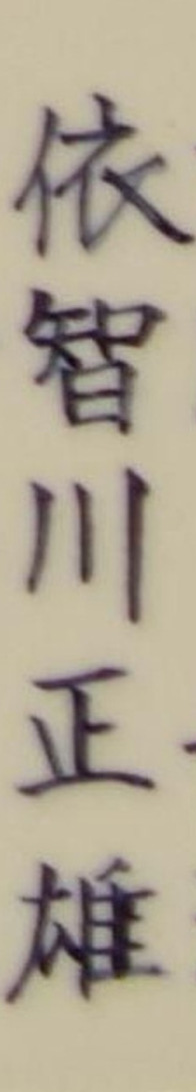依智川正雄
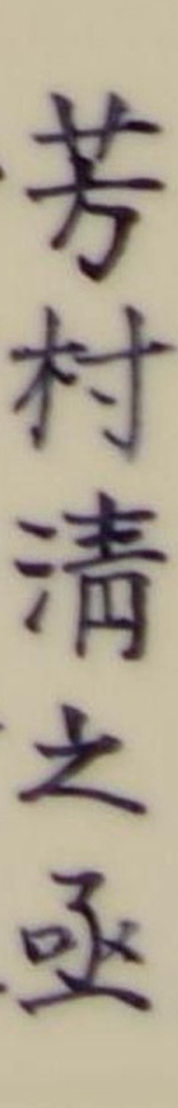芳村清之丞
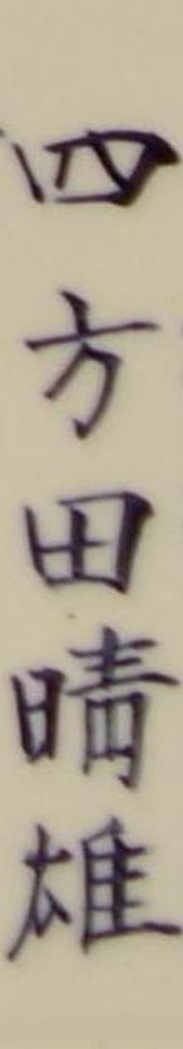四方田晴雄
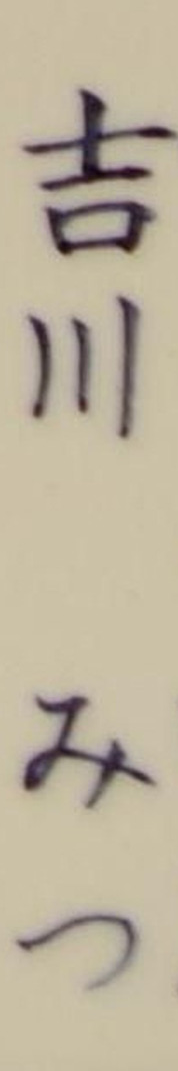吉川みつ
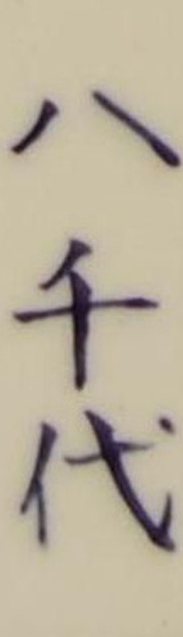八千代
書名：A~D
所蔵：koyasan kongobuji
